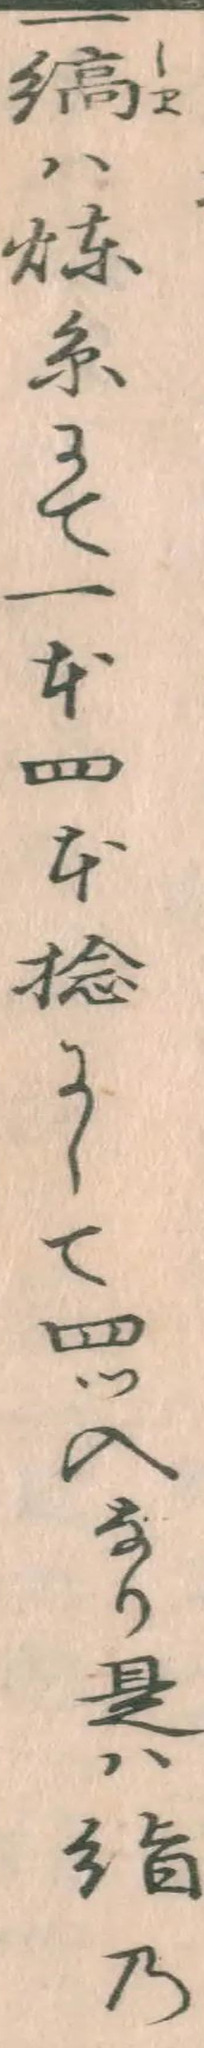一縞は煉糸にて一本四本捻にして四ッ入なり是は𥿻の
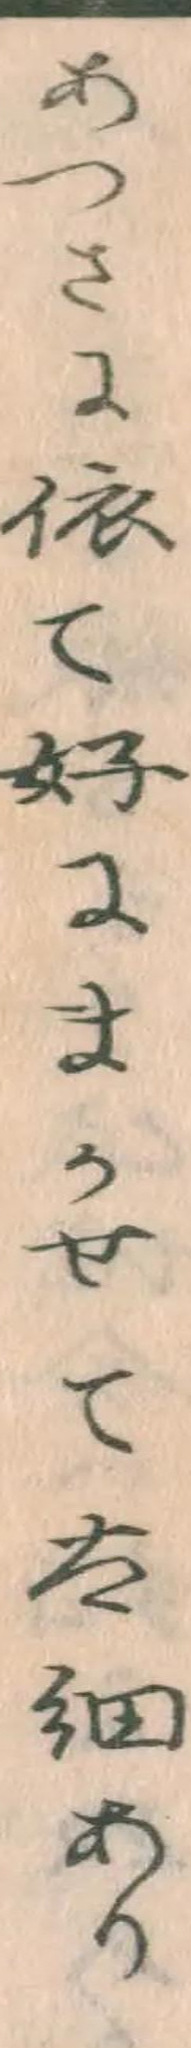あつさに依て好にまかせて太細あり
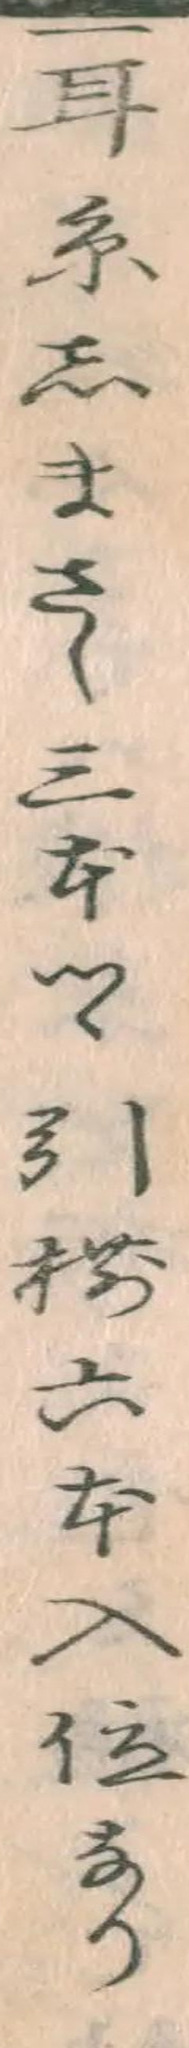一耳糸しまさし三本つゝ引揃六本入位なり
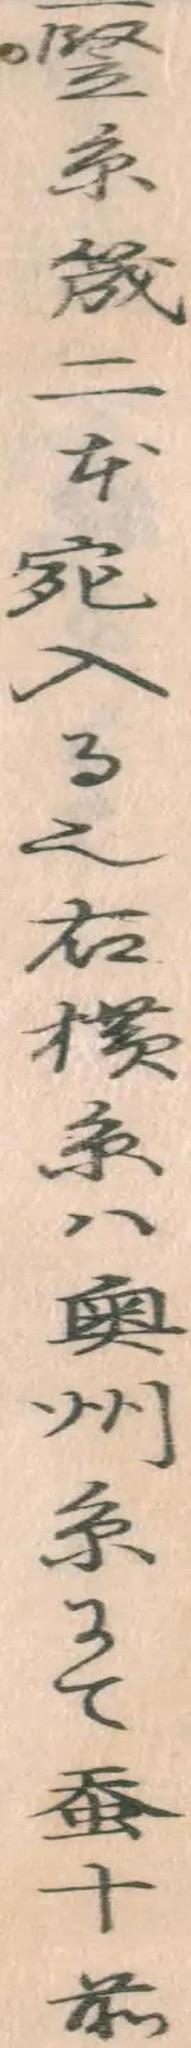一竪糸筬二本宛入る也右横糸は奥州糸にて蚕十前
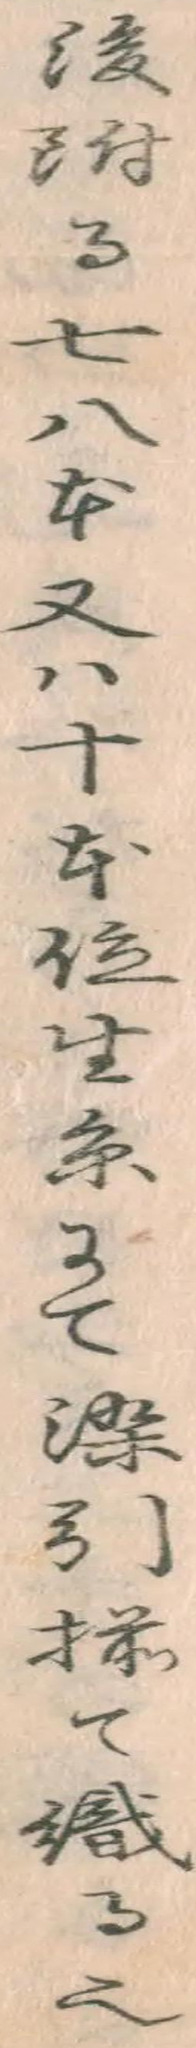後附る七八本又は十本位生糸にて染引揃て織る也
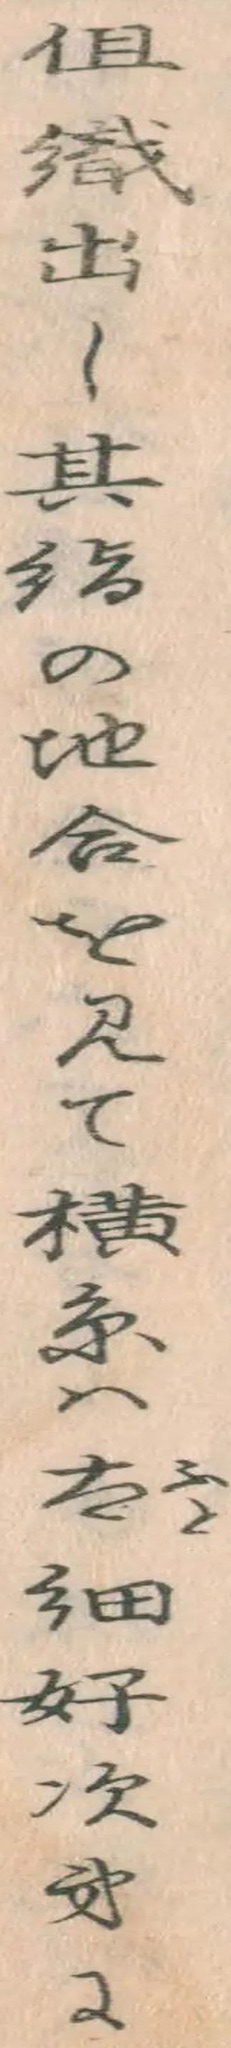但織出し其𥿻の地合を見て横糸は太細好次第に
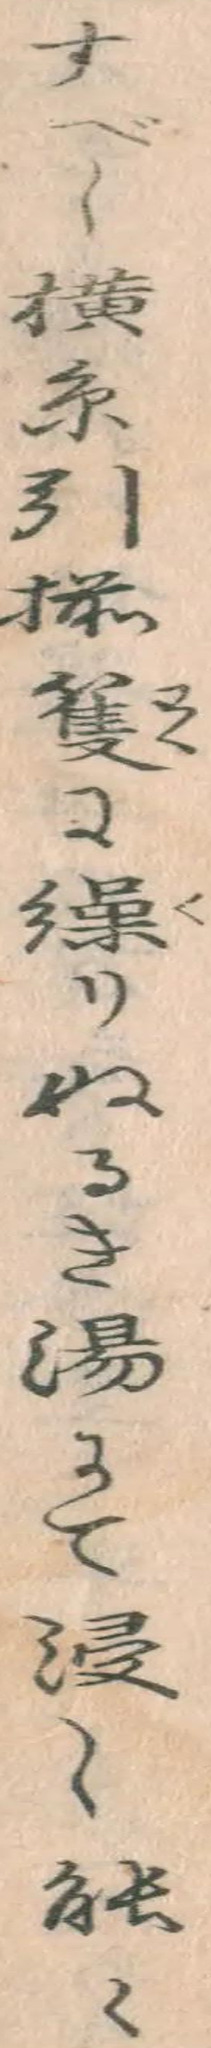すべし横糸引揃篗に繰りぬるき湯にて浸し能く

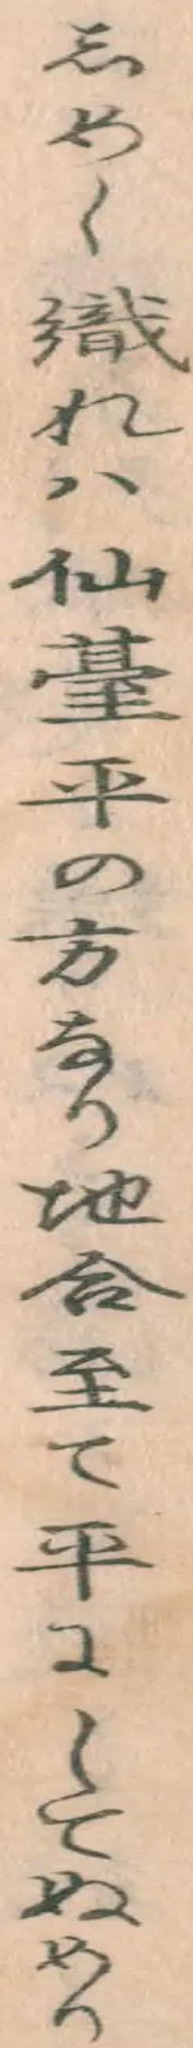しめし織れは仙台平の方なり地合至て平にしてぬめり
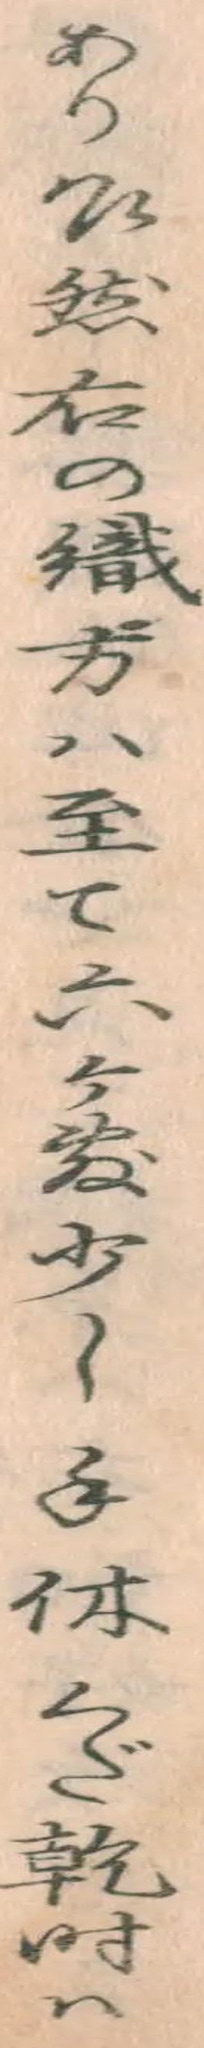あり乍然右の織方は至て六ヶ敷少し手休くだ乾時は
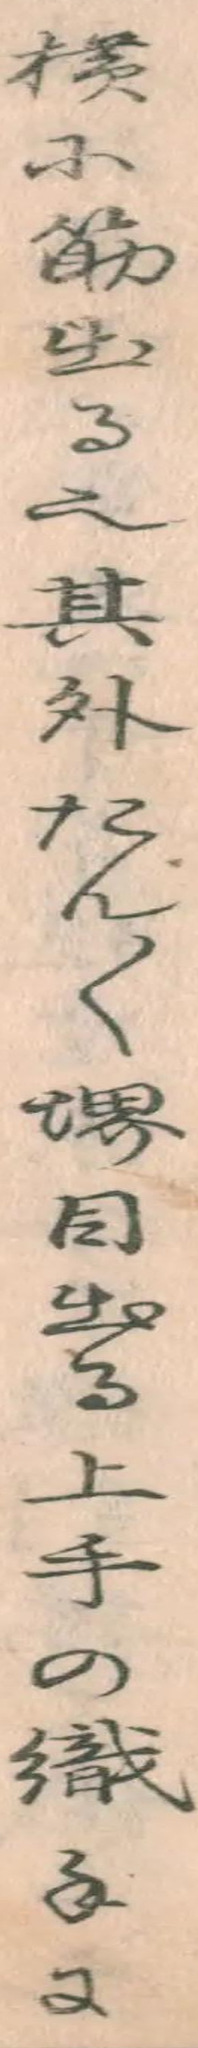横に筋出る也其外たん〳〵堺目出る上手の織手に
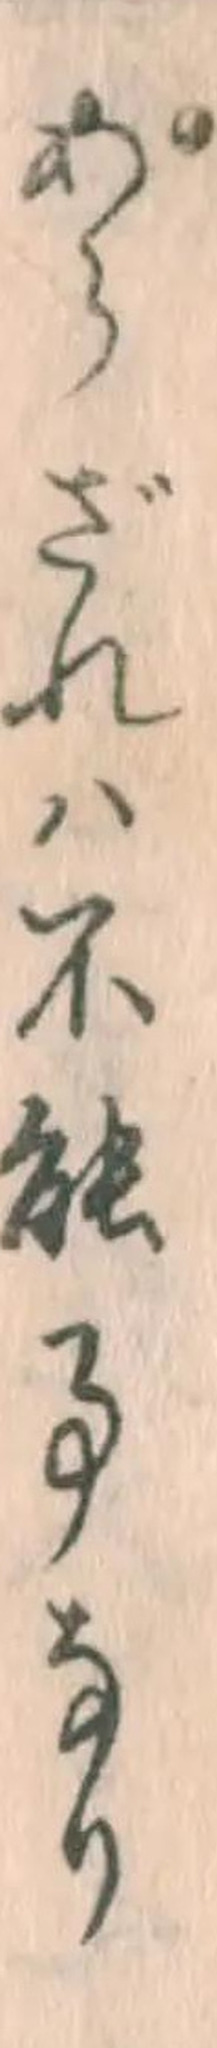あらざれは不能事なり
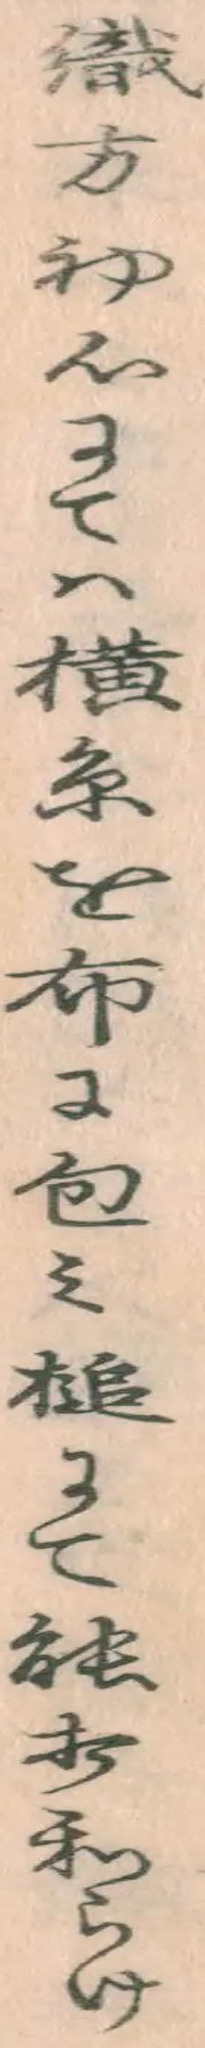一織方初心にては横糸を布に包み槌にて能打和らけ
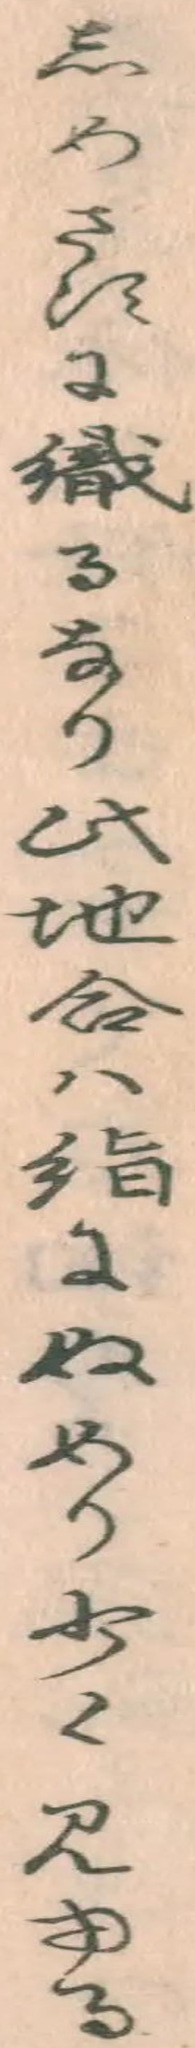しめさすに織るなり此地合は𥿻にぬめり少く見ゆる
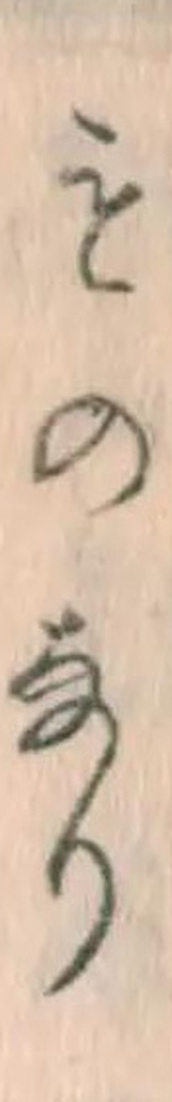ものなり
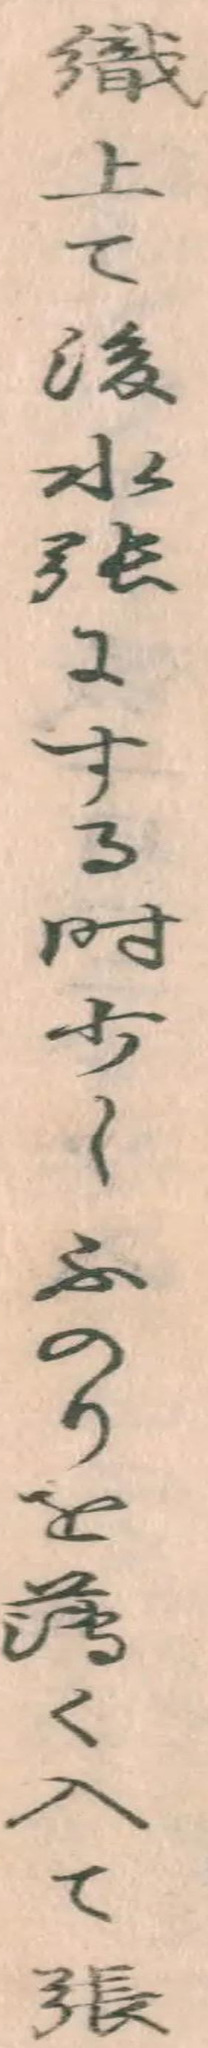一織上て後水張にする時少しふのりを薄く入て張
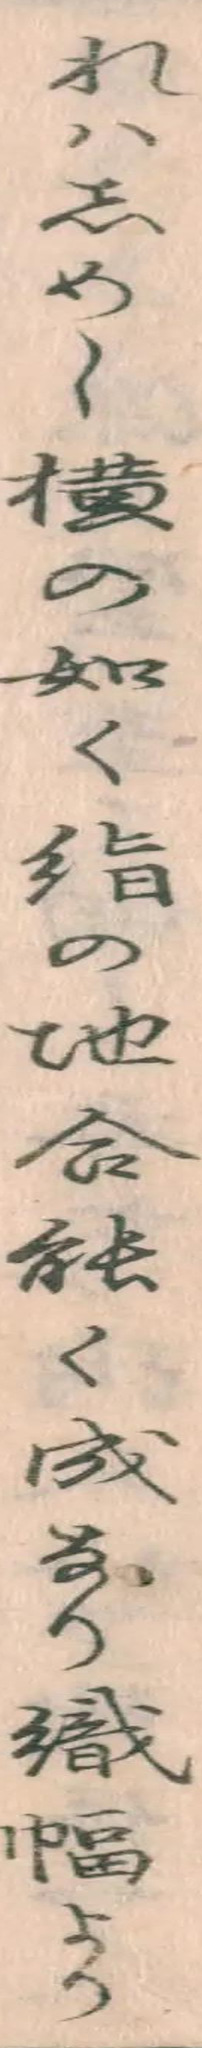れはしめし横の如く𥿻の地合能く成なり織幅より
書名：機織彙編 5巻. [2]
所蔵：国立国会図書館 National Diet Library, JAPAN
